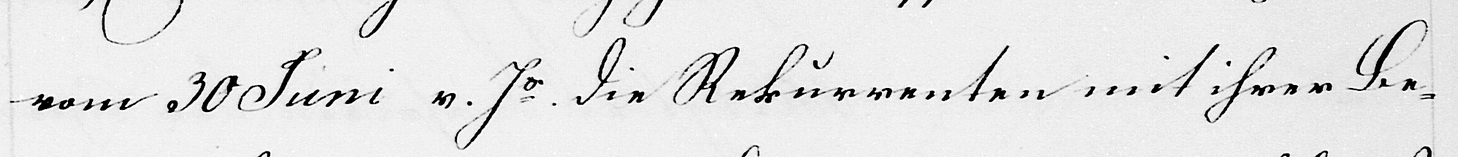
vom 30 Juni v. Js. die Rekurrenten mit ihrer Be¬
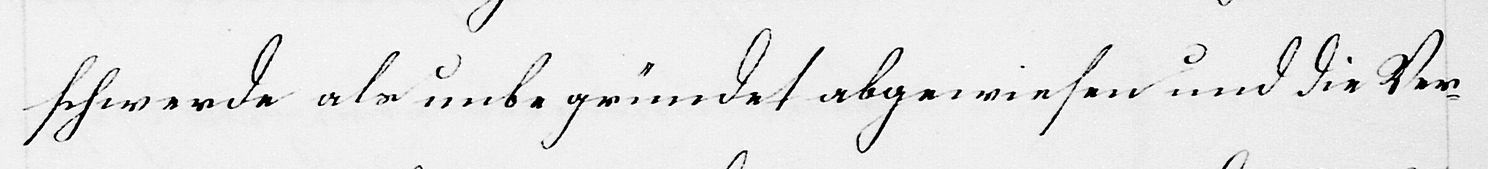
schwerde als unbegründet abgewiesen und die Ver¬
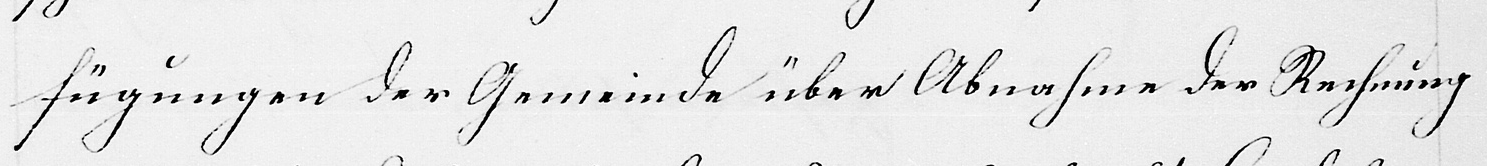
fügungen der Gemeinde über Abnahme der Rechnung
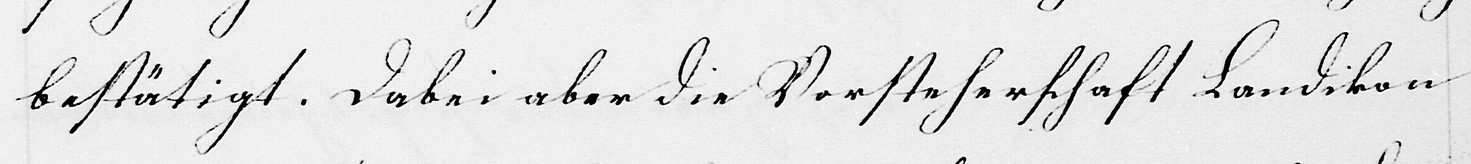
bestätigt. Dabei aber die Vorsteherschaft Landikon
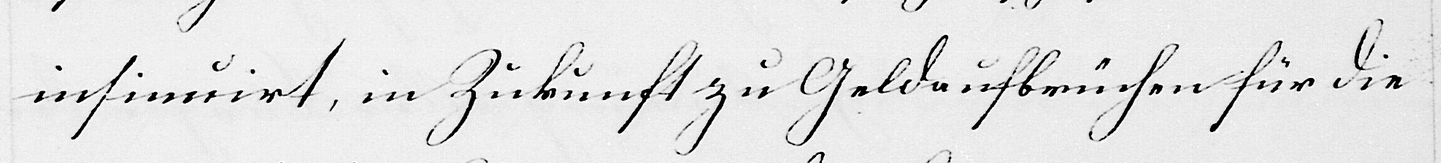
insinuirt, in Zukunft zu Geldaufbrüchen für die
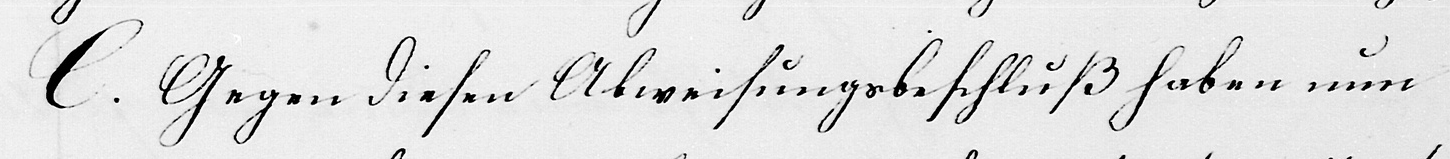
C. Gegen diesen Abweisungsbeschluß haben nun
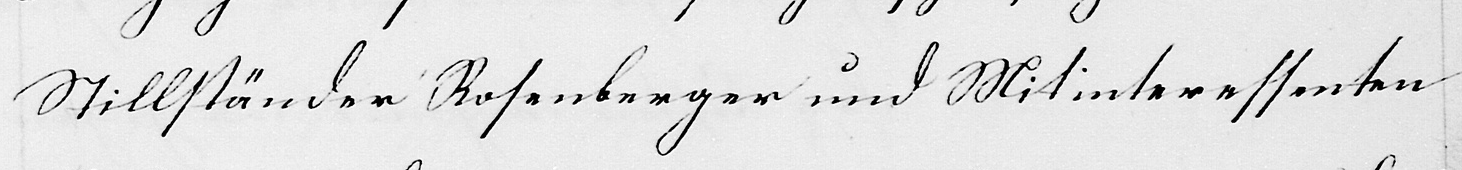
Stillständer Rosenberger und Mitinteressenten
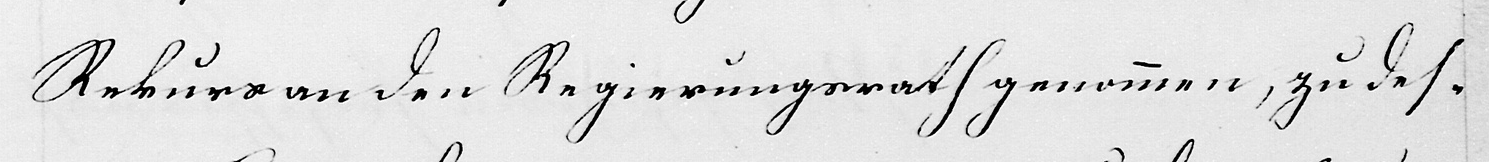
Rekurs an den Regierungsrath genommen, zu des¬
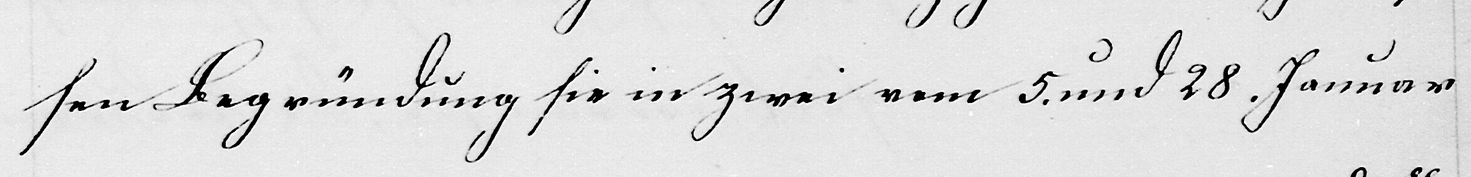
sen Begründung sie in zwei vom 5. und 28. Januar
